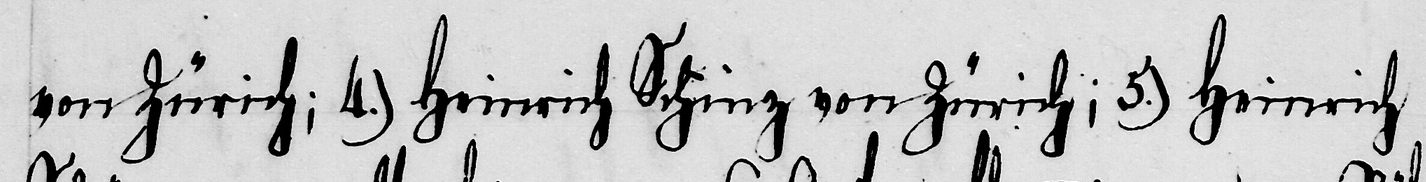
von Zürich; 4.) Heinrich Schinz von Zürich; 5.) Heinrich
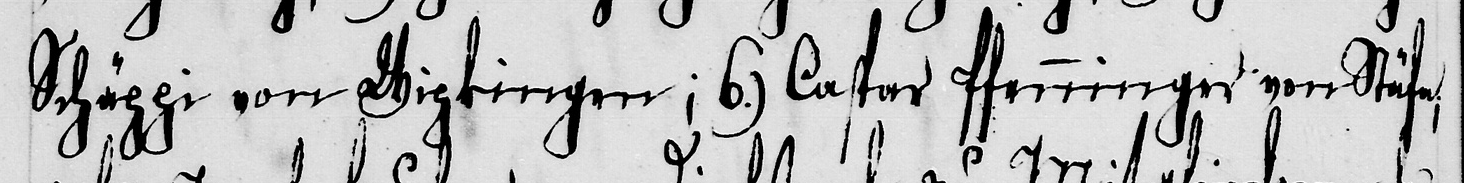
Schäppi von Wipkingen; 6.) Caspar Pfenninger von Stäfa;
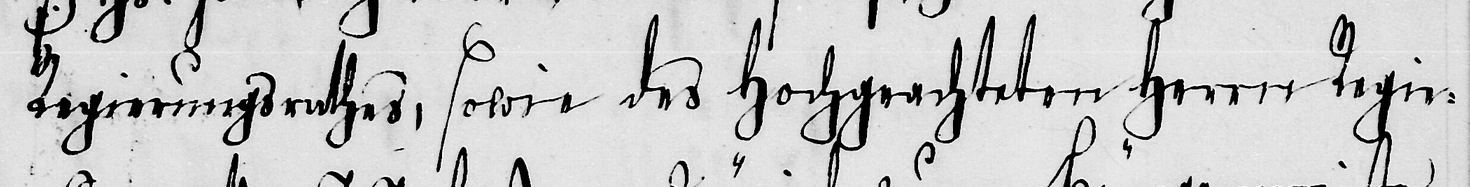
Regierungsrathes, sowie des Hochgeachteten Herrn Regi¬
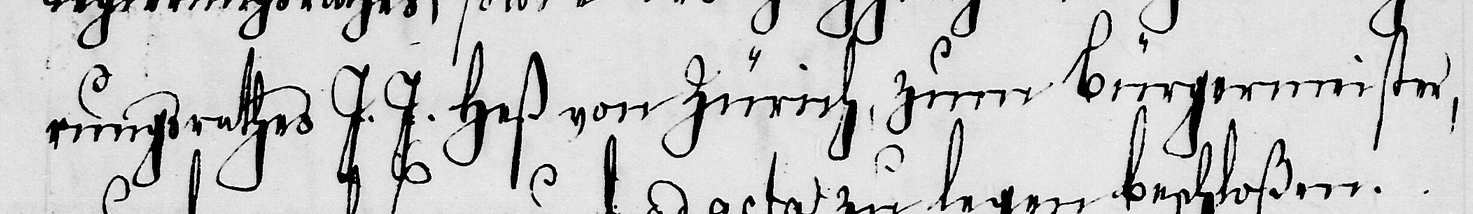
erungsrathes J. J. Heß von Zürich, zum Bürgermeister,
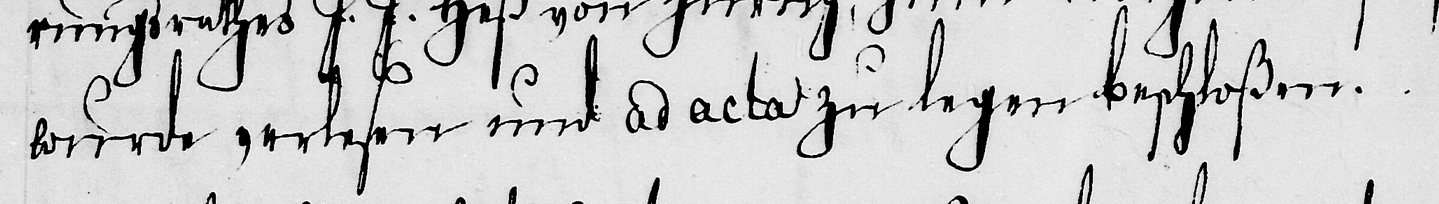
wurde verlesen und ad acta zu legen beschloßen.
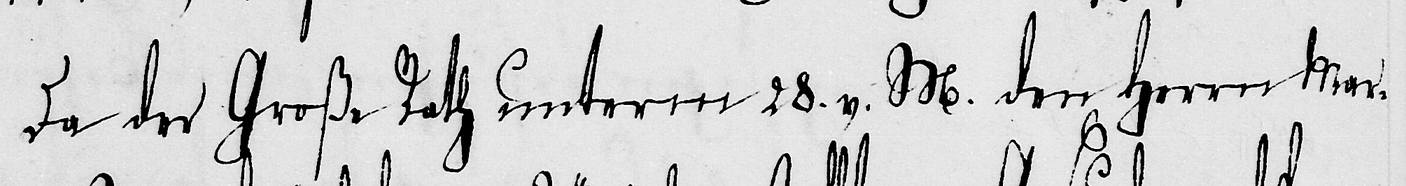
Da der Große Rath unterm 28. v. M. den Herrn Mar¬
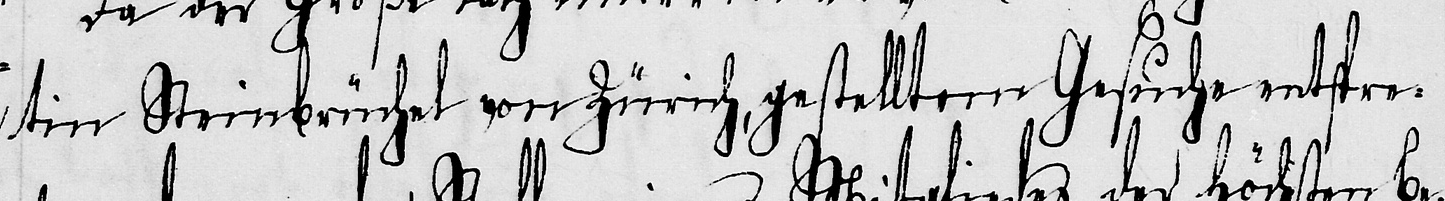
tin Steinbrüchel von Zürich, gestelltem Gesuche entspre¬
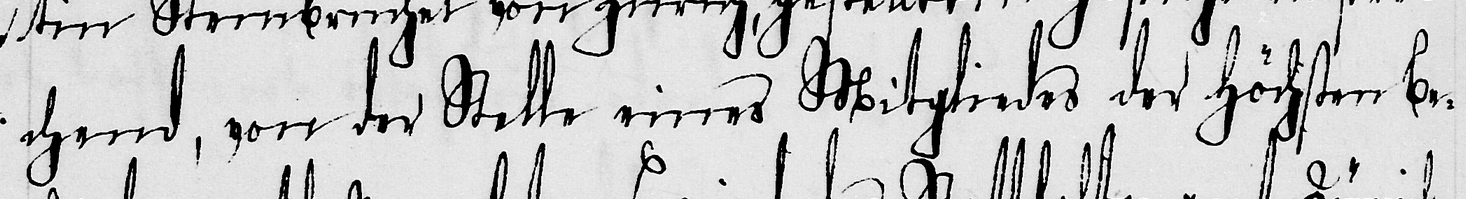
chend, von der Stelle eines Mitgliedes der Höchsten B¬
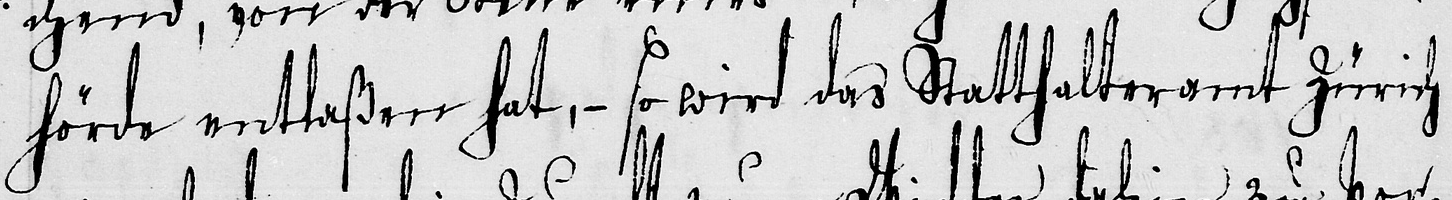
ehörde entlaßen hat, – so wird das Statthalteramt Zürich
